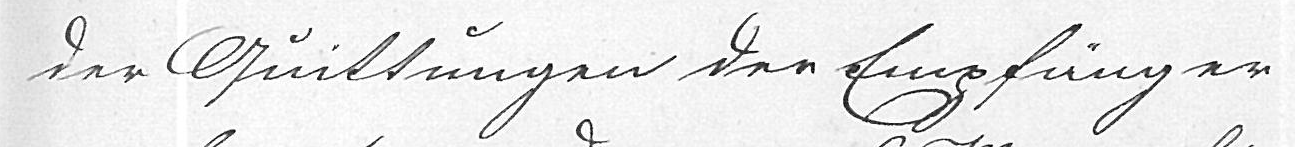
der Quittungen der Empfänger
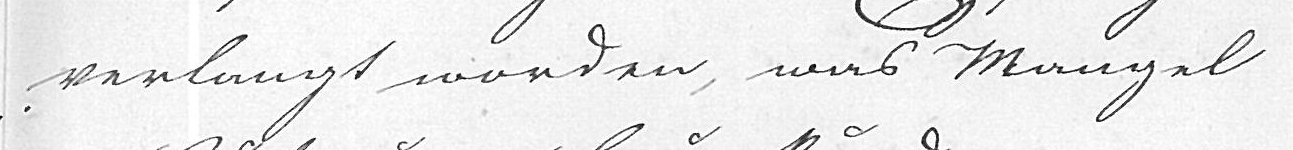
verlangt worden, was Mangel
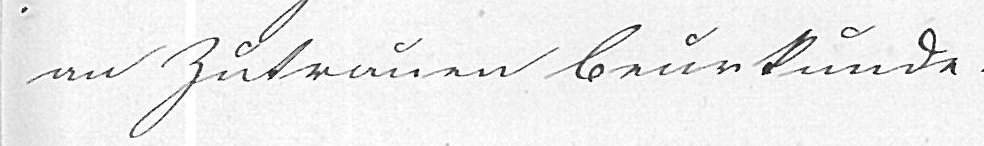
an Zutrauen beurkunde.
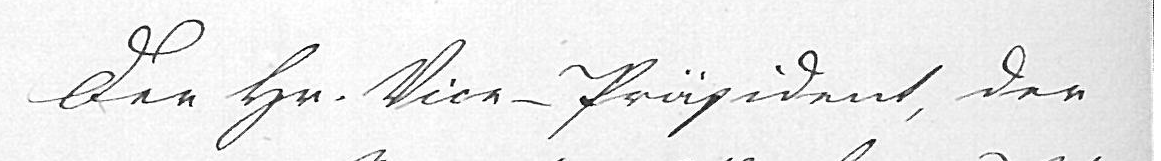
Der Hr. Vice-Präsident, der
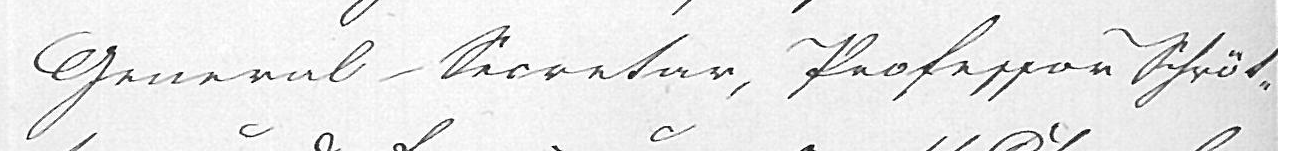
General-Secretär, Professor Schröt-
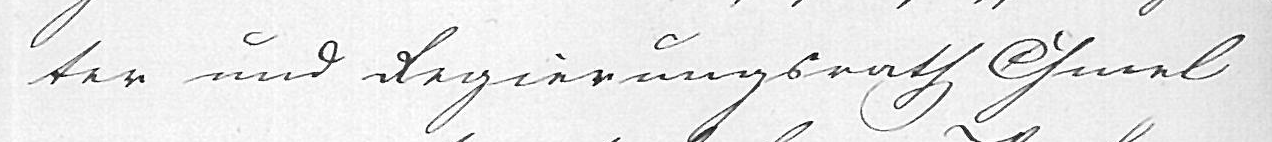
ter und Regierungsrath Chmel
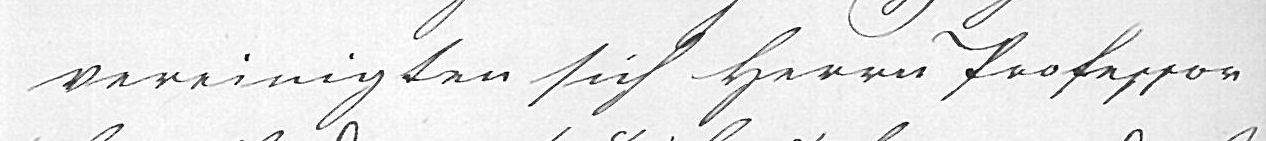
vereinigten sich Herrn Professor
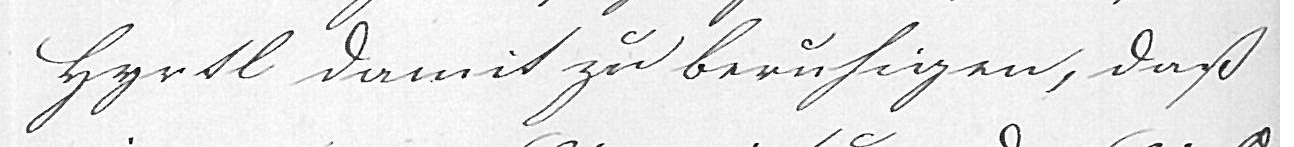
Hyrtl damit zu beruhigen, daß
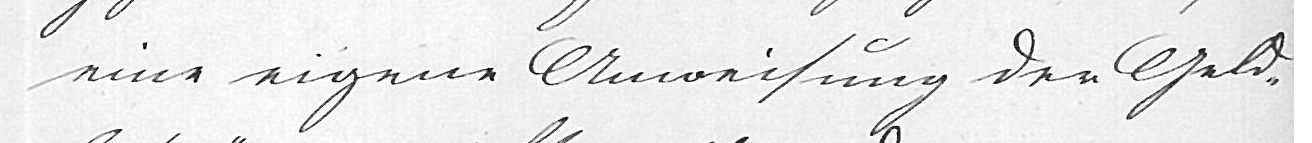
eine eigene Anweisung der Geld-
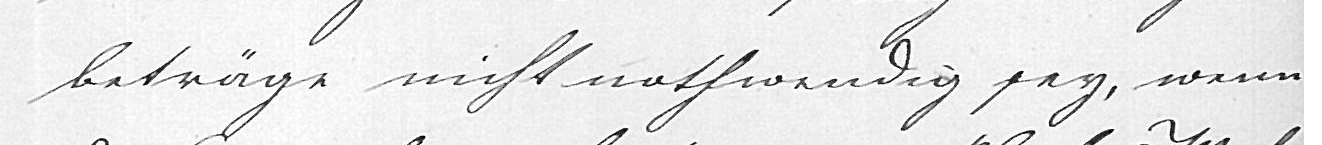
beträge nicht nothwendig sey, wenn
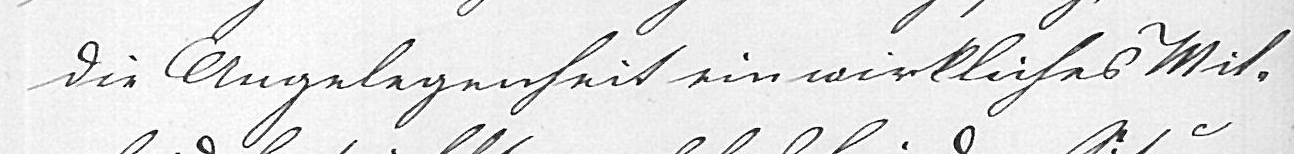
die Angelegenheit ein wirkliche Mit-
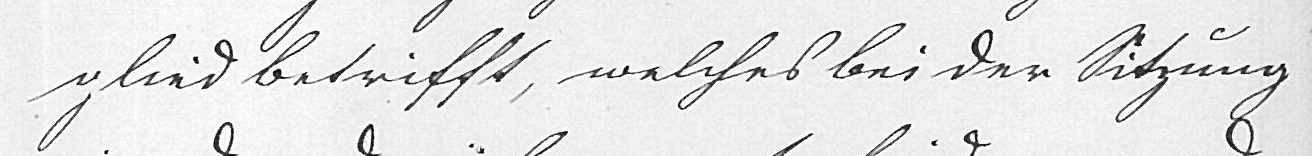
glied betrifft, welches bei der Sitzung
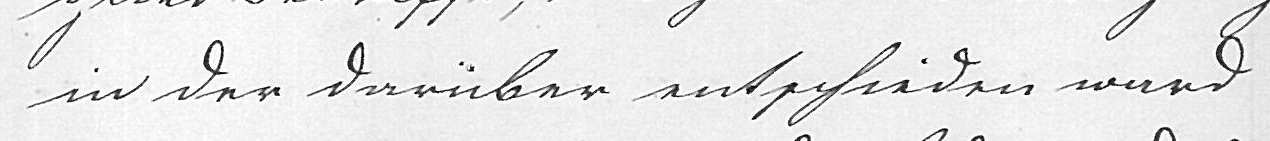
in der darüber entschieden ward
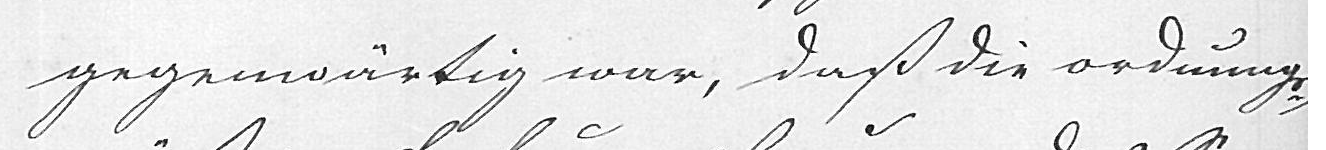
gegenwärtig war, daß die ordnungs
